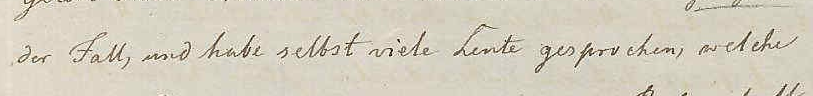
der Fall, und habe selbst viele Leute gesprochen, welche
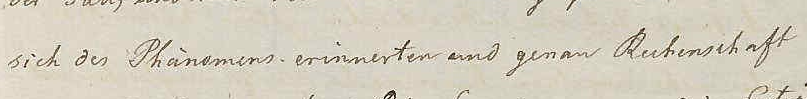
sich des Phänomens erinnerten und genau Rechenschaft
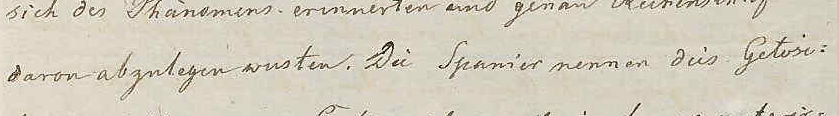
davon abzulegen wusten. Die Spanier nennen dies Getöse:
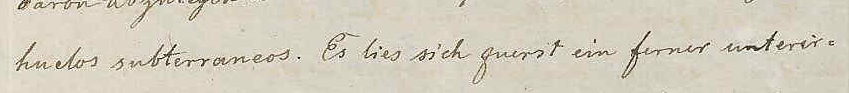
huelos subterraneos. Es lies sich zuerst ein ferner unterir-
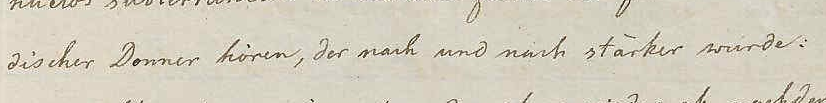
discher Donner hören, der nach und nach stärker wurde:
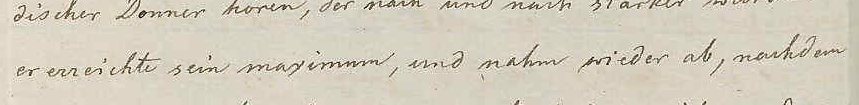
er erreichte sein maximum, und nahm wieder ab, nachdem
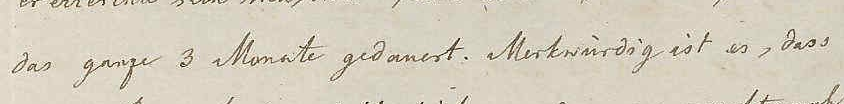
das ganze 3 Monate gedauert. Merkwürdig ist es, dass
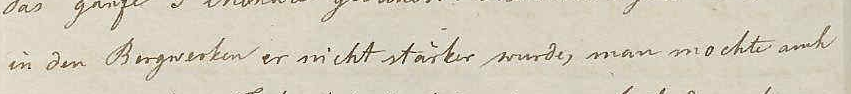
in den Bergwerken er nicht stärker wurde, man mochte auch
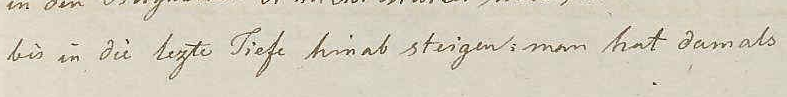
bis in die lezte Tiefe hinab steigen: man hat damals
